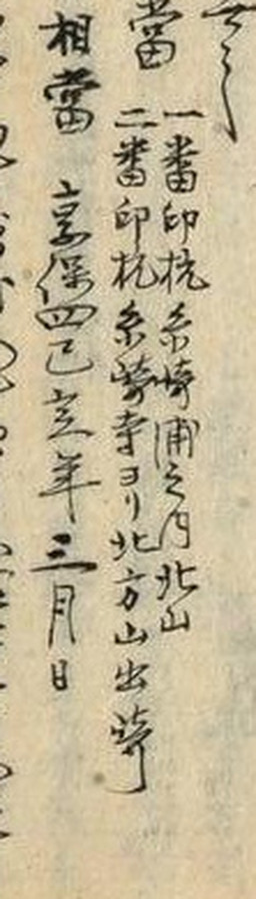二番印杭糸崎寺ヨリ北方山出崎
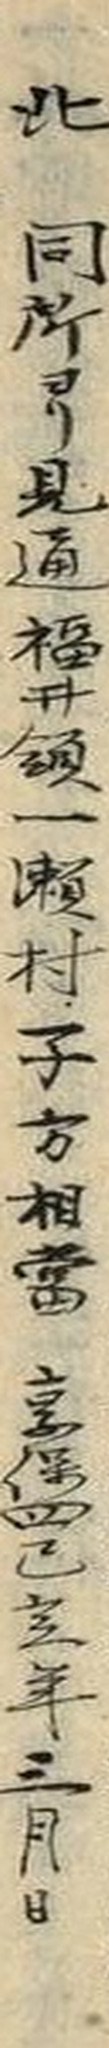北同所ヨリ見通福井領一瀬村子方相当享保四己亥年三月日
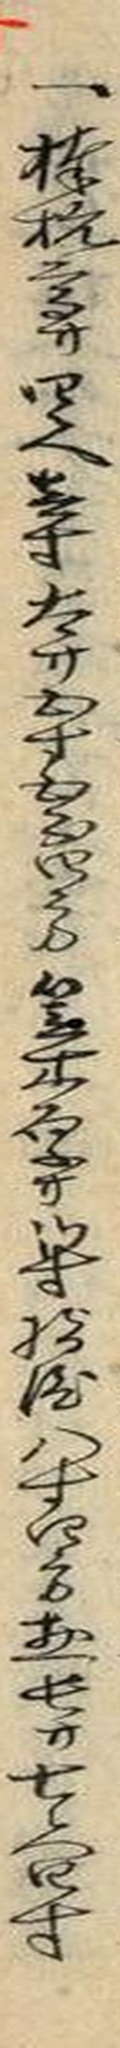一棒杭高サ四尺壱寸太サ五寸五分四方笠木厚サ弐寸指渡八寸四方惣長サ七尺四寸

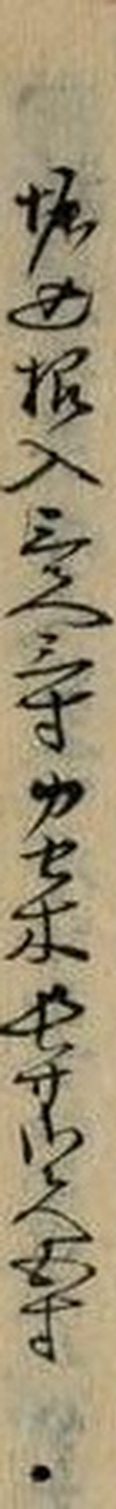堀込根入三尺三寸カセ木長サ弐尺五寸
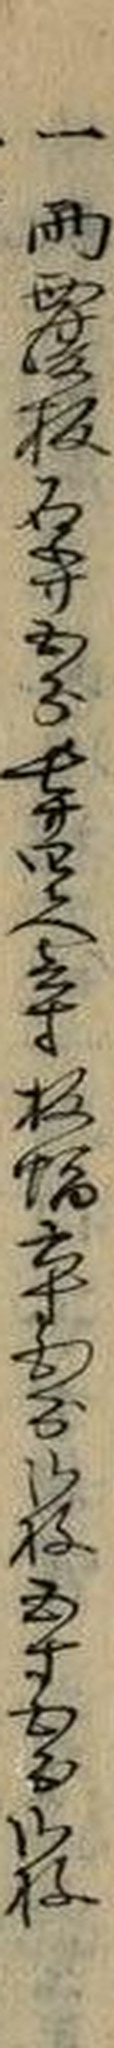一雨覆板厚サ五分長サ四尺壱寸板幅六寸五分弐枚五寸五分弐枚
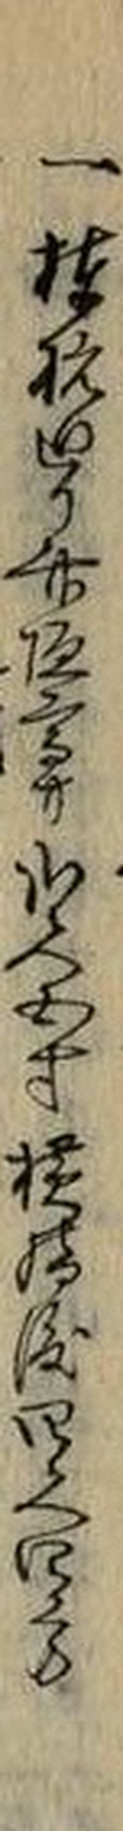一棒杭廻り竹垣高サ弐尺五寸横指渡四尺四方
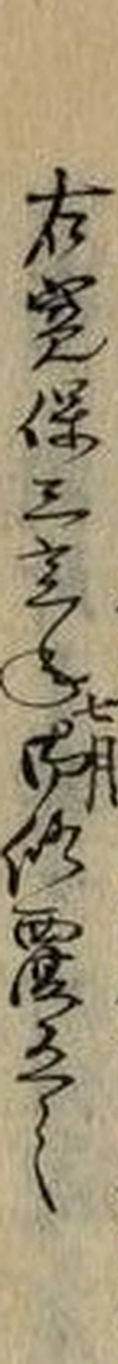右寛保三亥年七月御修覆有之
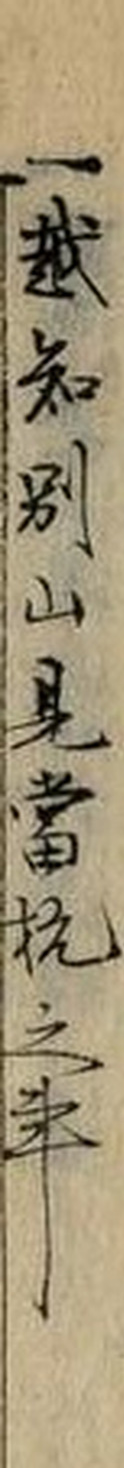一越知別山見当杭之事
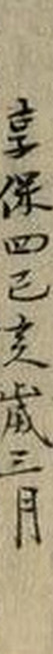享保四己亥歳三月
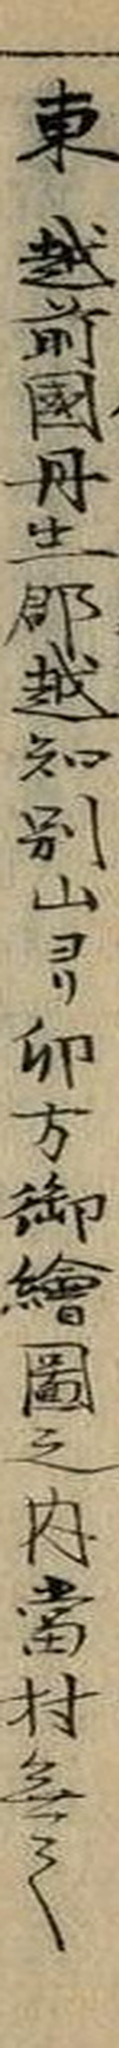東越前国丹生郡越知別山ヨリ卯方御絵図之内当村無之
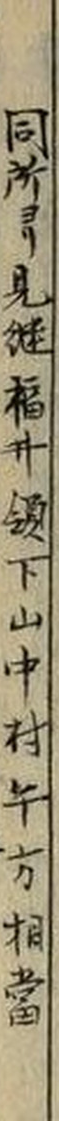南同所ヨリ見継福井領下山中村午方相当
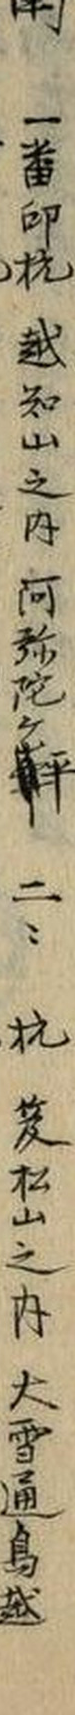一番印杭越知山之内阿弥陀ケ平二同杭笈松山之内大雪通鳥越
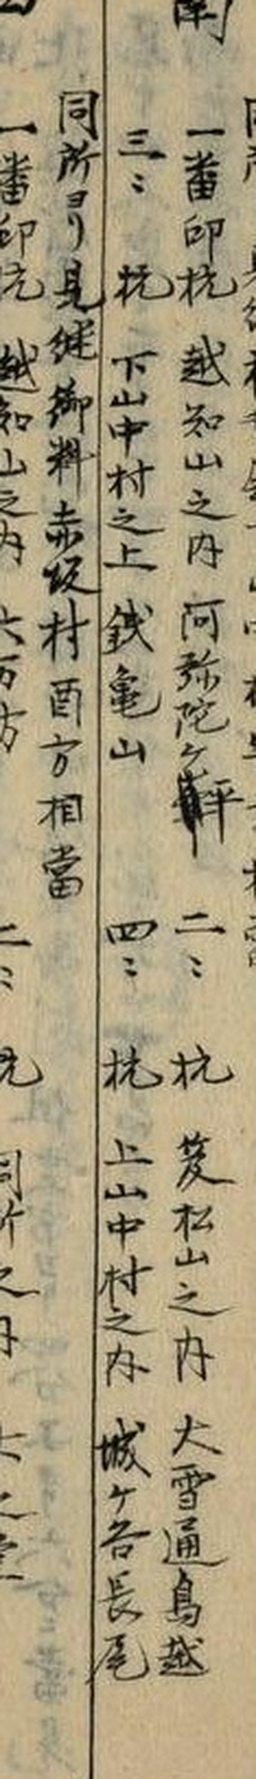三同杭下山中村之上銭亀山四同杭上山中村之内城ケ谷長尾
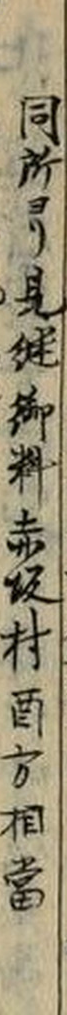西同所ヨリ見継御料赤坂村酉方相当
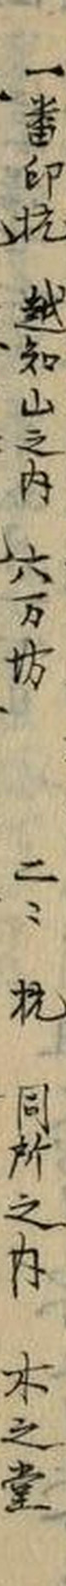一番印杭越知山之内六万坊二同杭同所之内木之堂
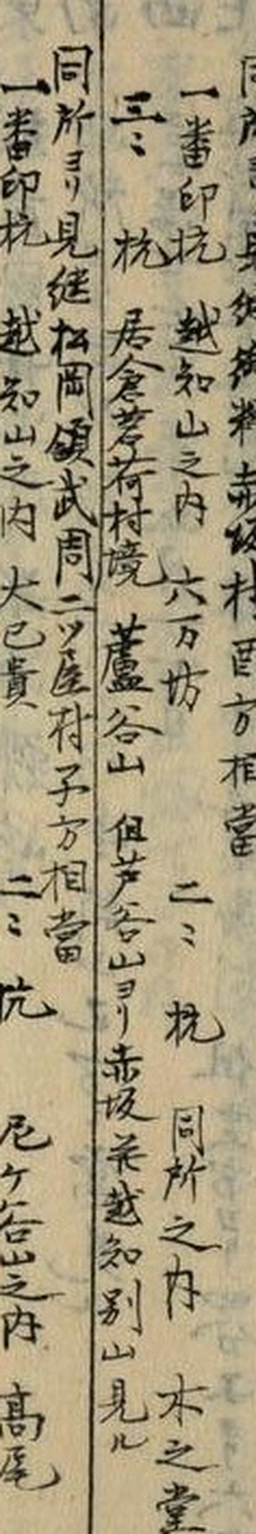三同杭居倉茗荷村境蘆谷山但芦谷山ヨリ赤坂幷越知別山見ル
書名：御国他国諸事之部
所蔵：福井県文書館 Fukui Prefectural Archives
